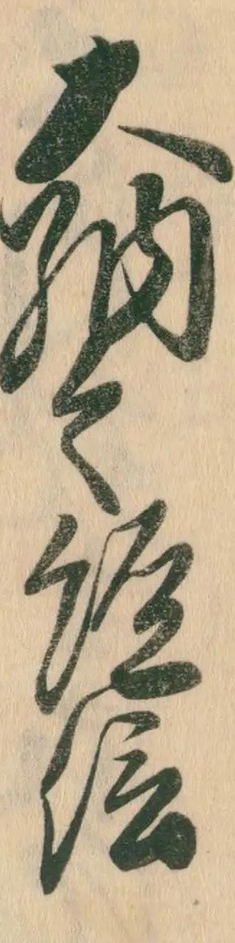大納言経信
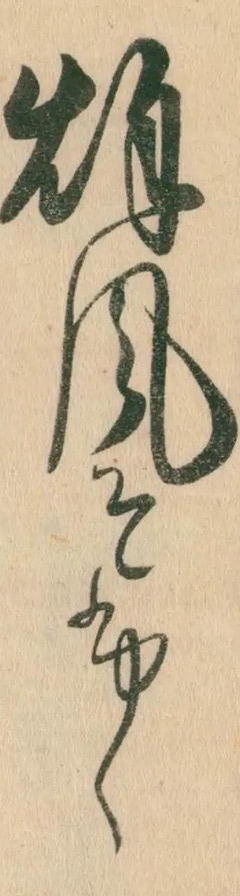秋風そふく
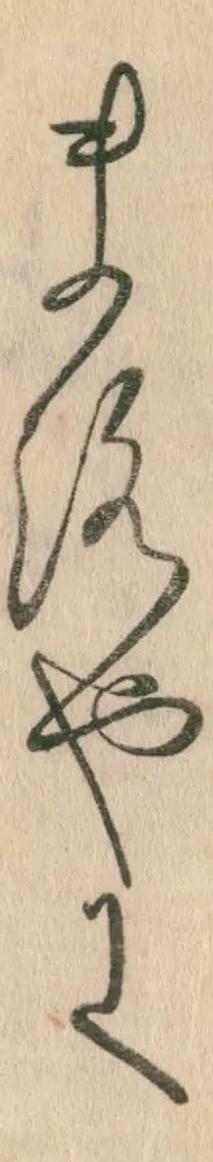まろやに
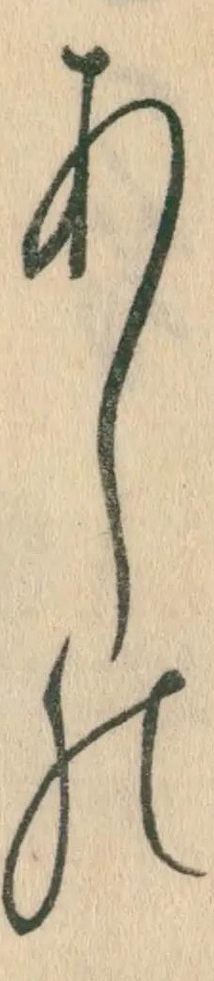あしの
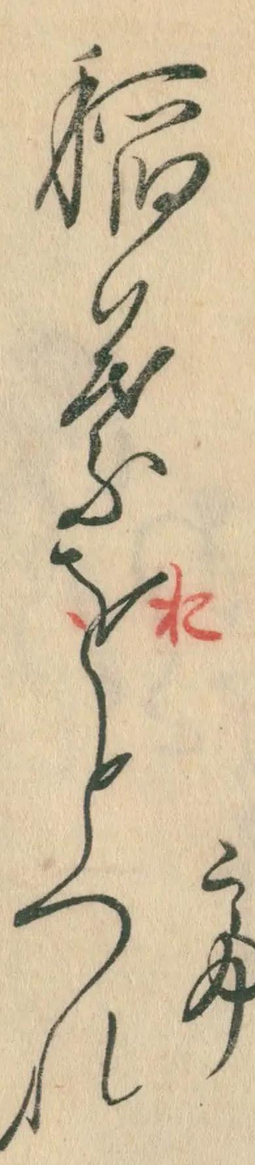稲葉をとつれ
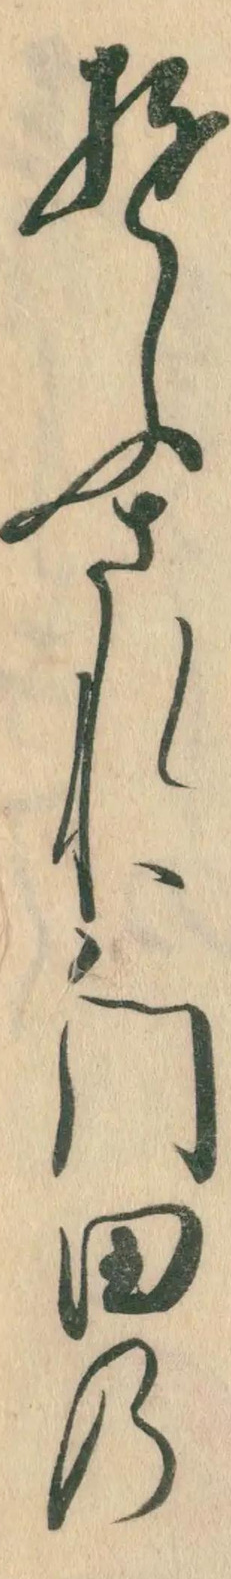ゆうされは門田の

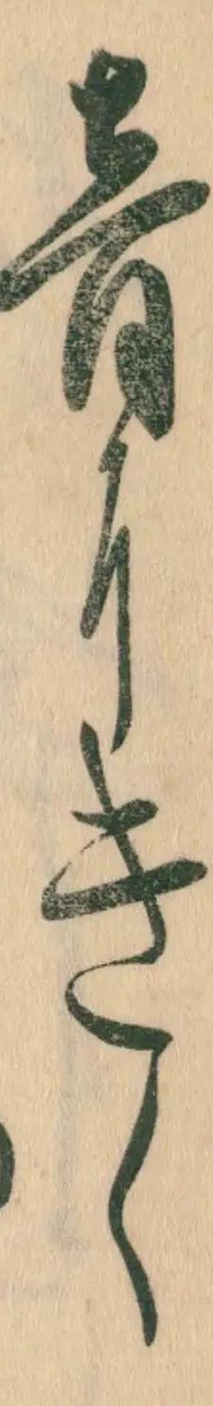音にきく
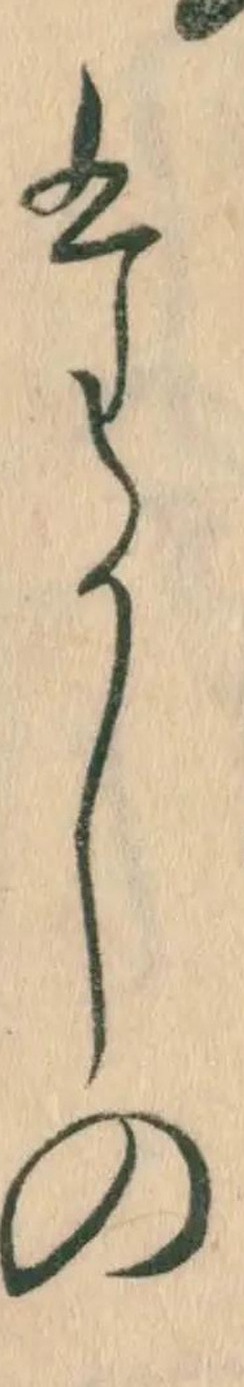たかしの
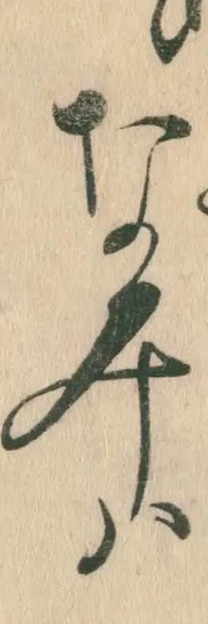なみは
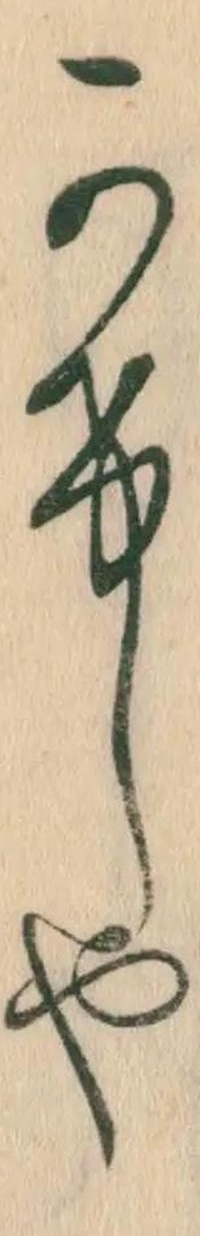かけしや
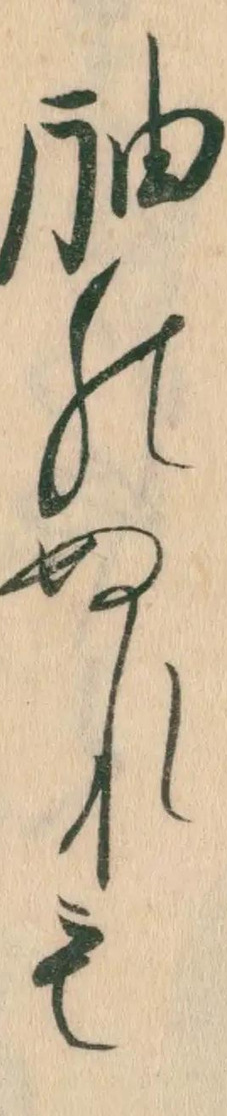袖のぬれも
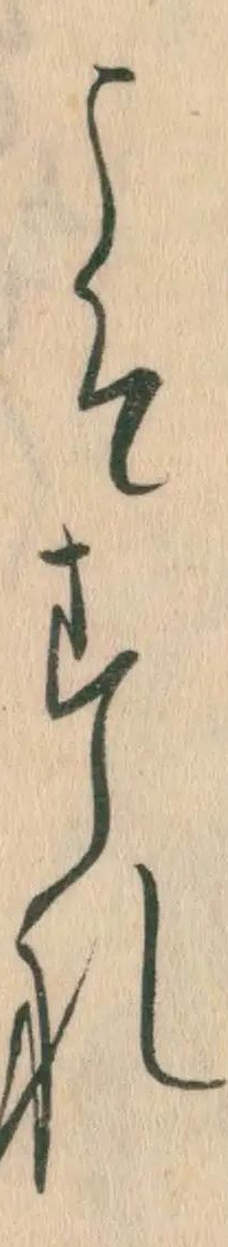こそすれ
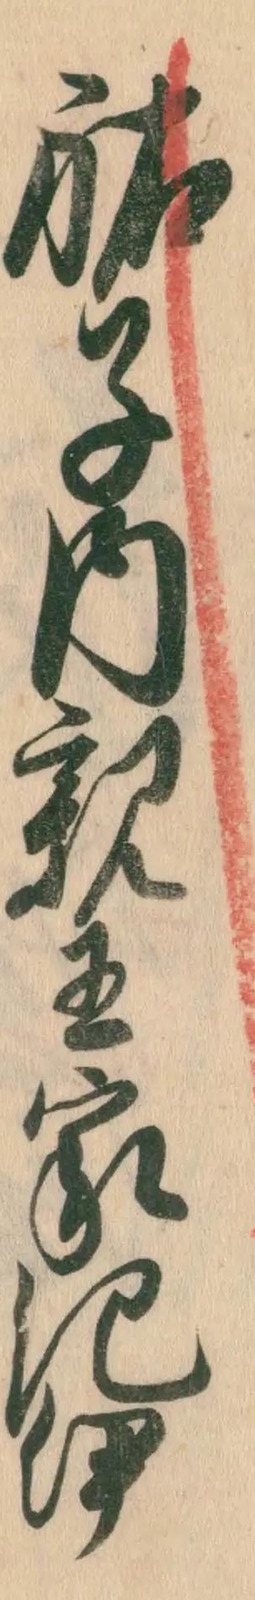祐子内親王家紀伊
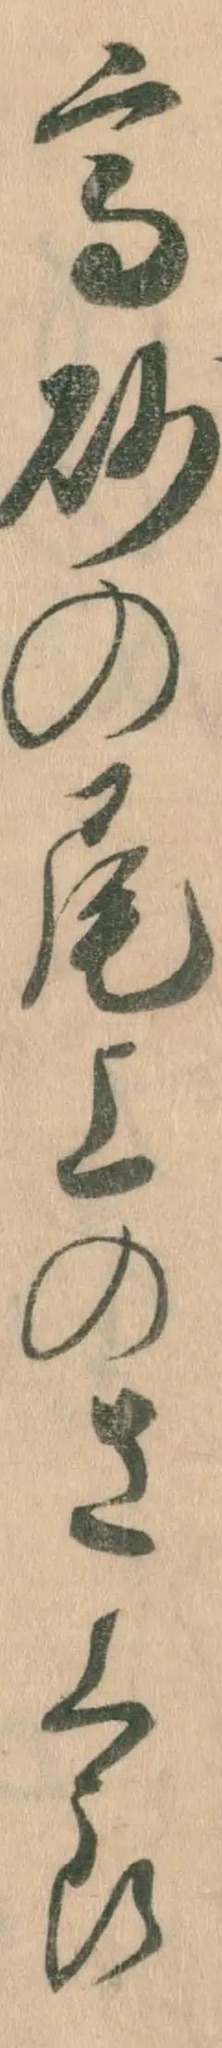高砂の尾上のさくら
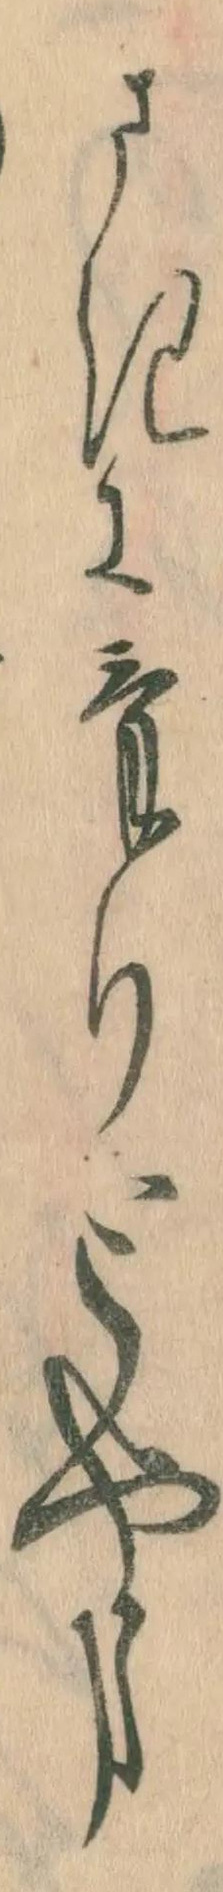さきにけりとやま
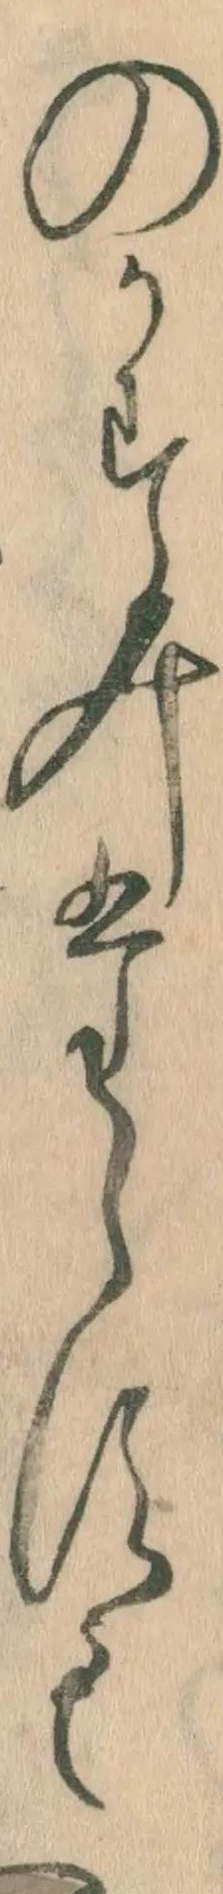のかすみたゝすも
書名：錦百人一首あつま織
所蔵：国立国会図書館 National Diet Library, JAPAN
